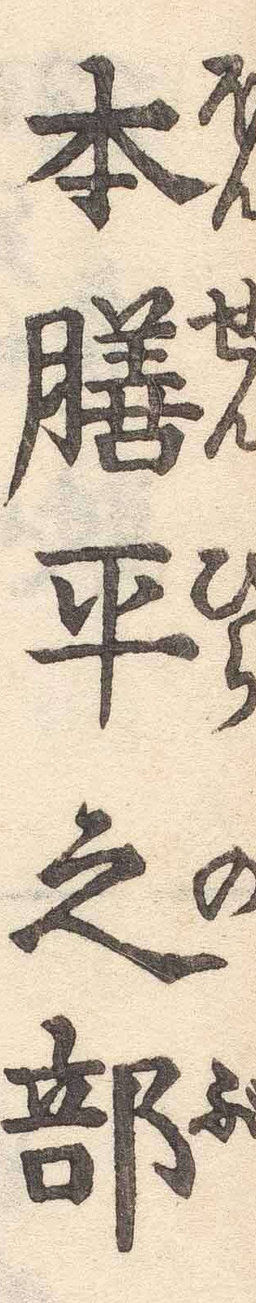本膳平之部

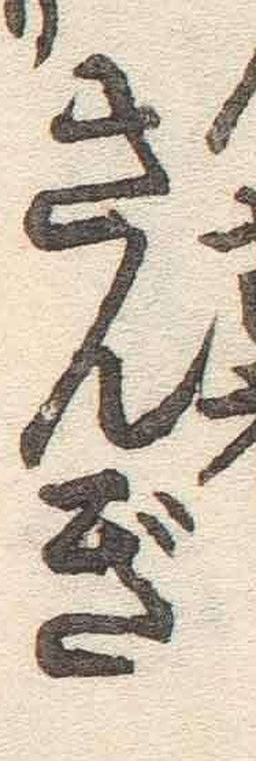さんぎ
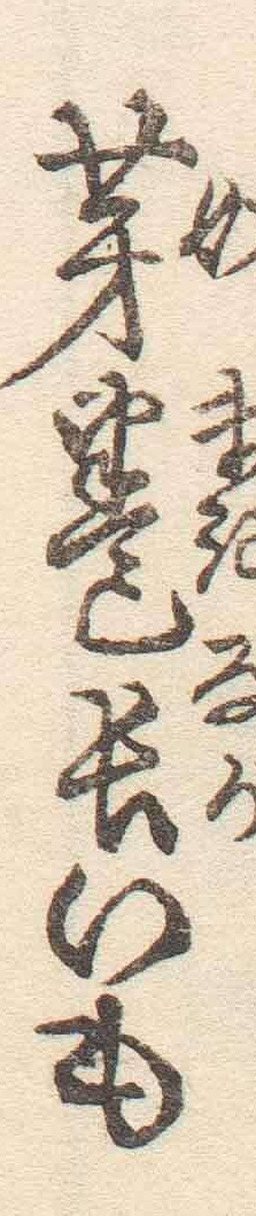菜芽巻長いも
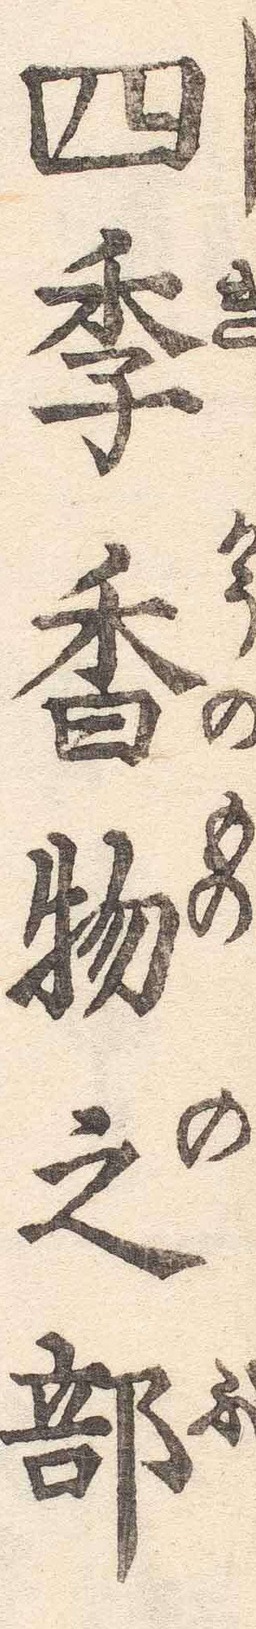四季香物之部
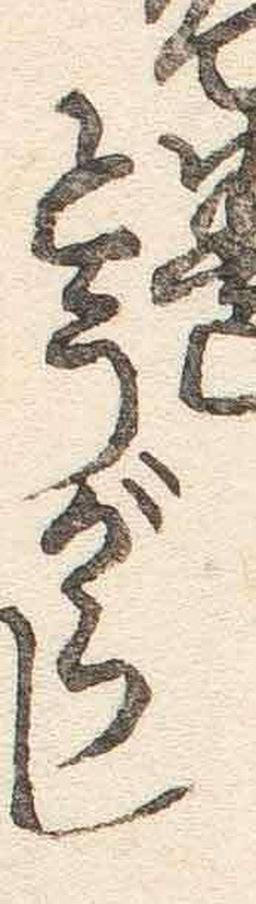とうがらし
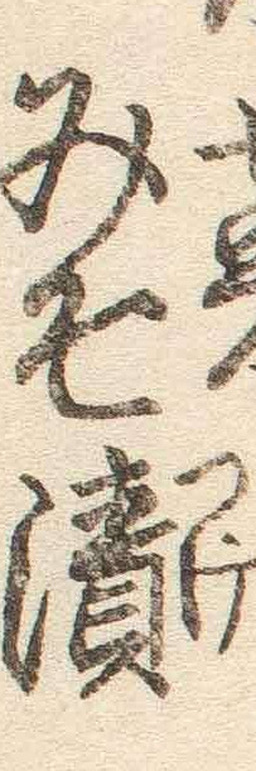みそ漬
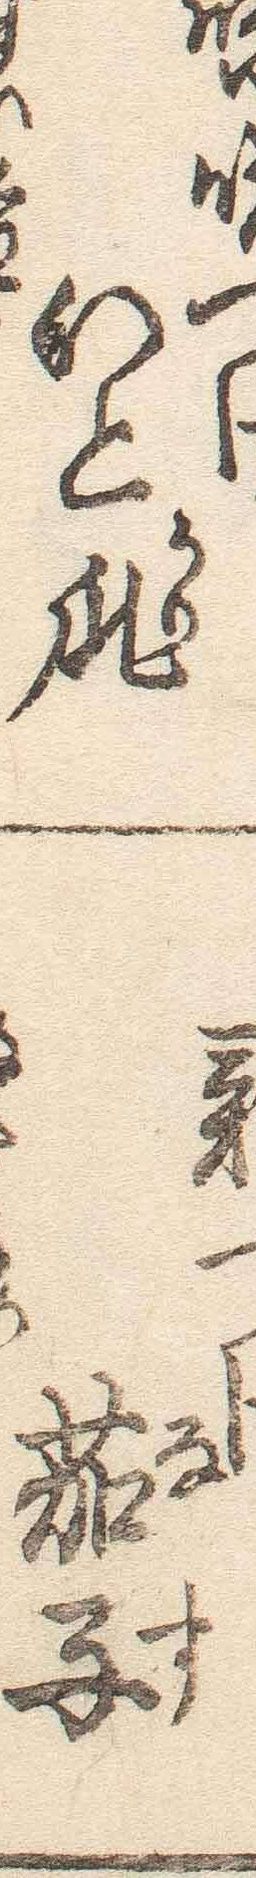いと瓜茄子

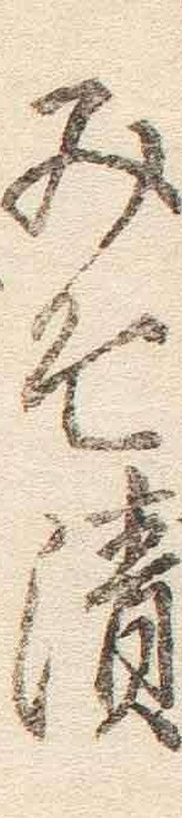みそ漬
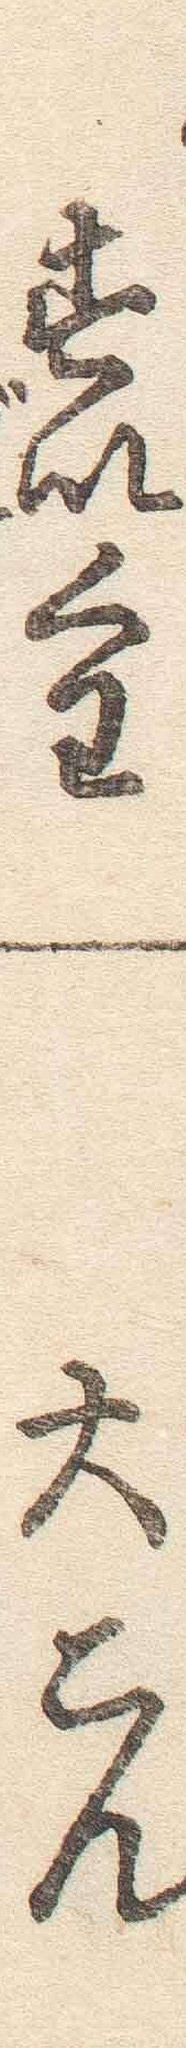すいくわ大こん
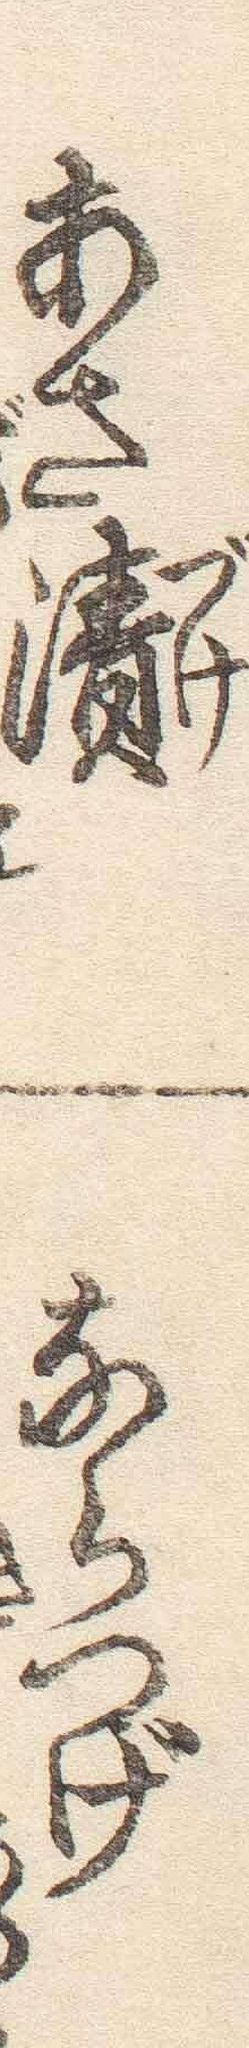あさ漬ならづけ
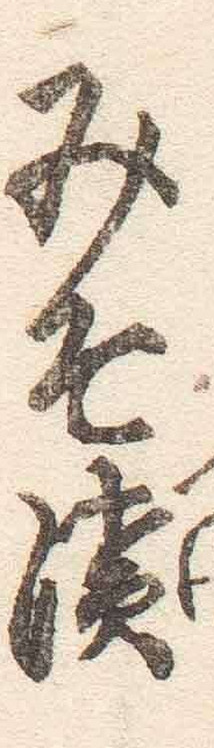みそ漬
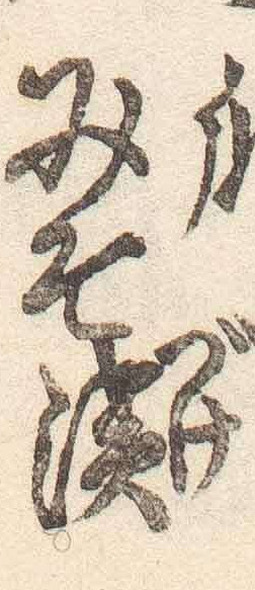みそ漬
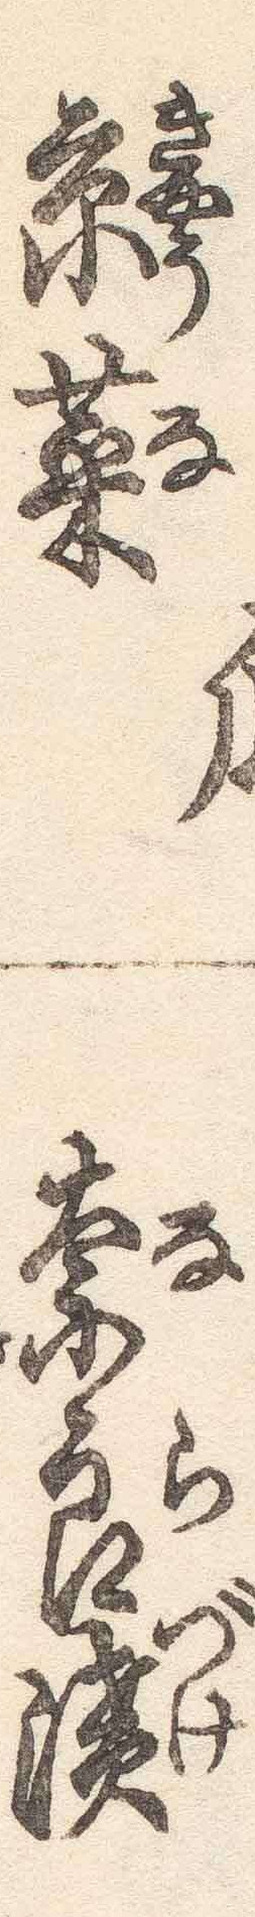京菜奈良漬
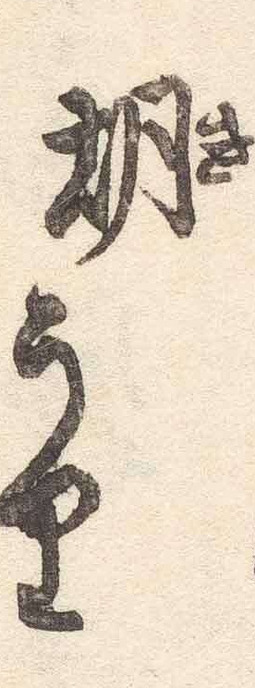漬うり
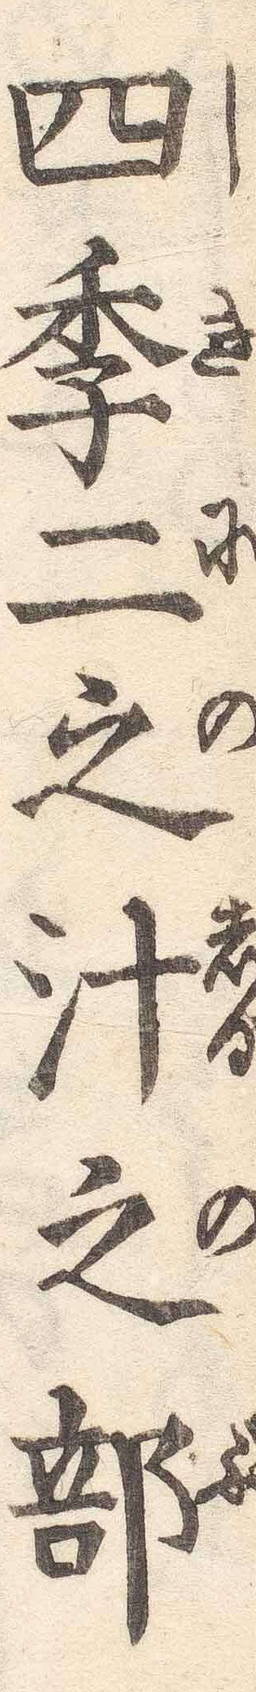四季二之汁之部
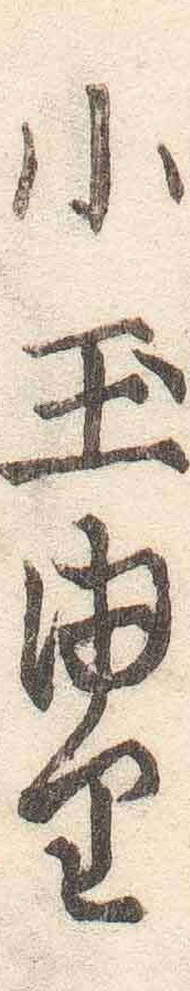小玉ゆり
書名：料理通
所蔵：東京学芸大学附属図書館 国文学研究資料館
